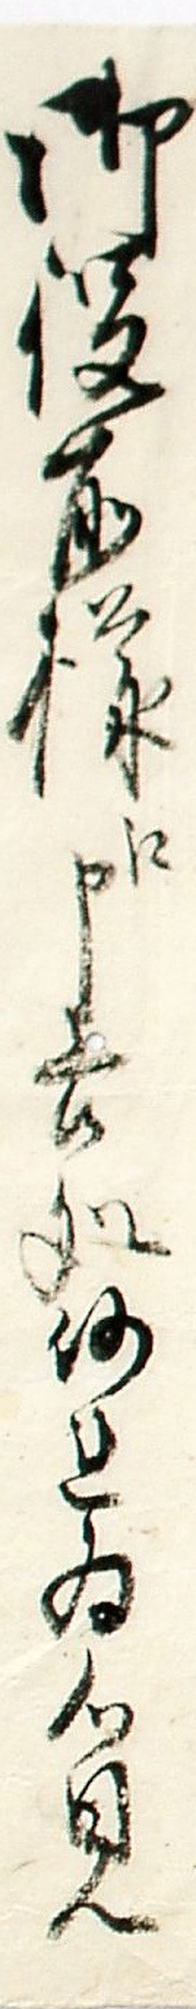御役所様え申上候処何れ為心見
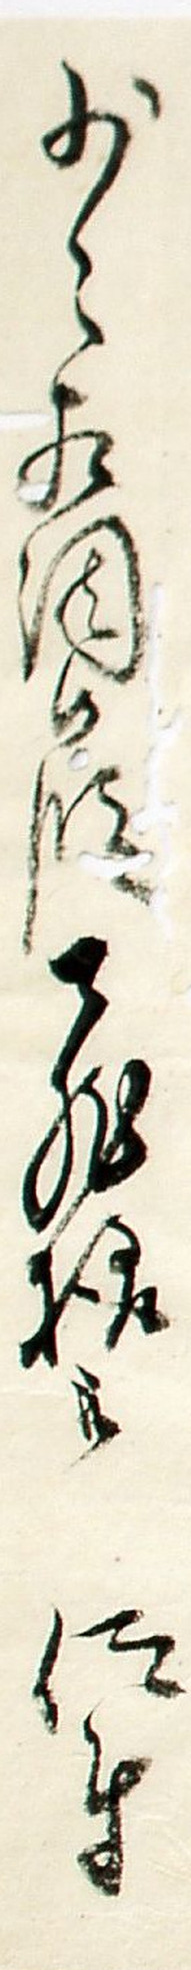少々相調候段可然様被仰付
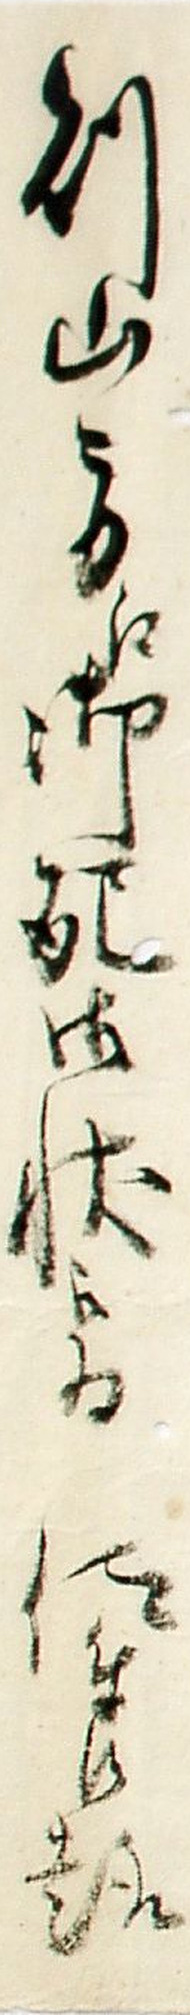則山方え御配御状被為仰付候趣
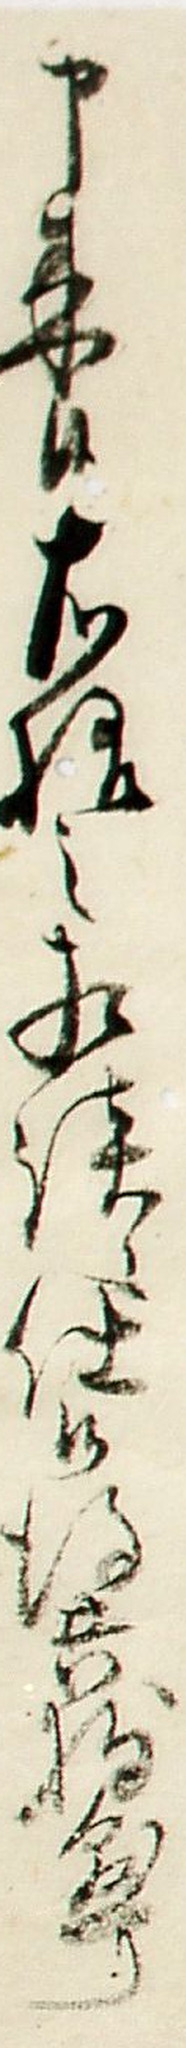申来候右様之相談に仕候得共指懸り

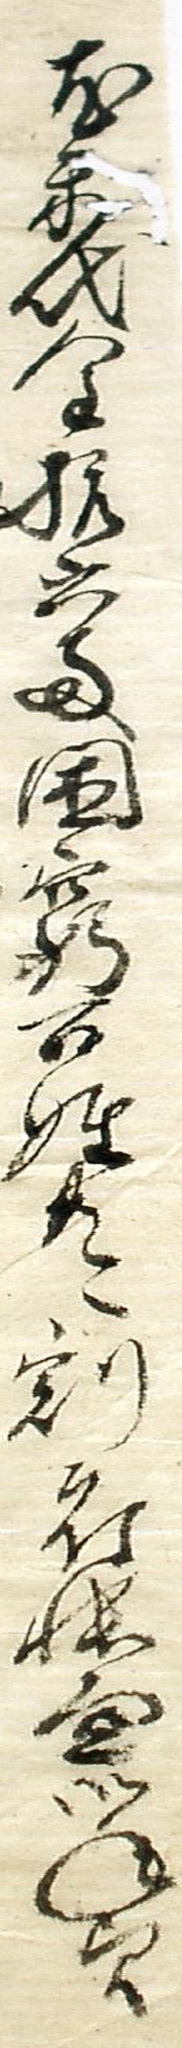尤米代金拾六両困窮百姓共へ割符帳面御年貢
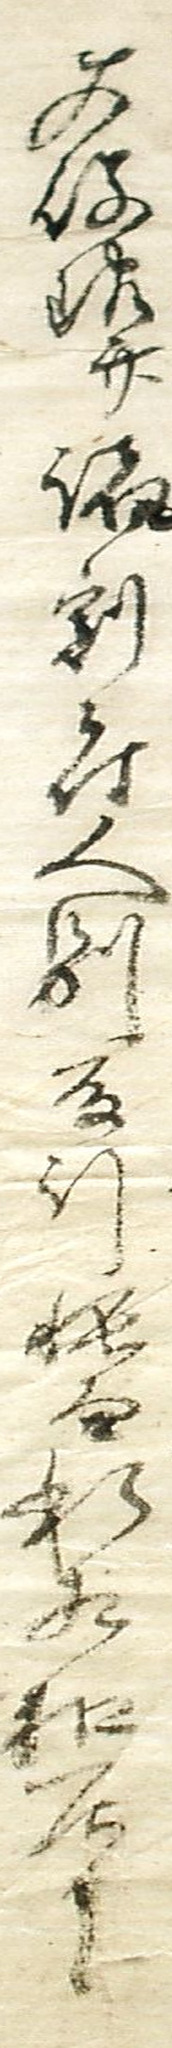使役銀幷諸割符人別取引帳面私相控可被申候

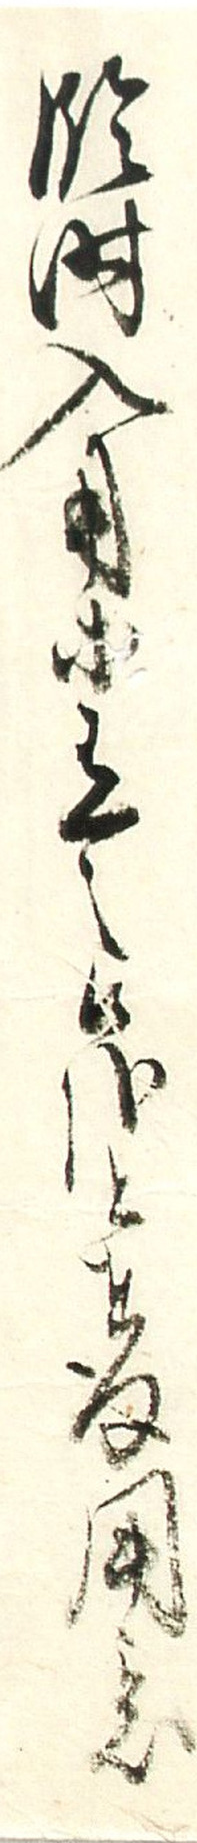臨時入用等有之候哉と奉存用意
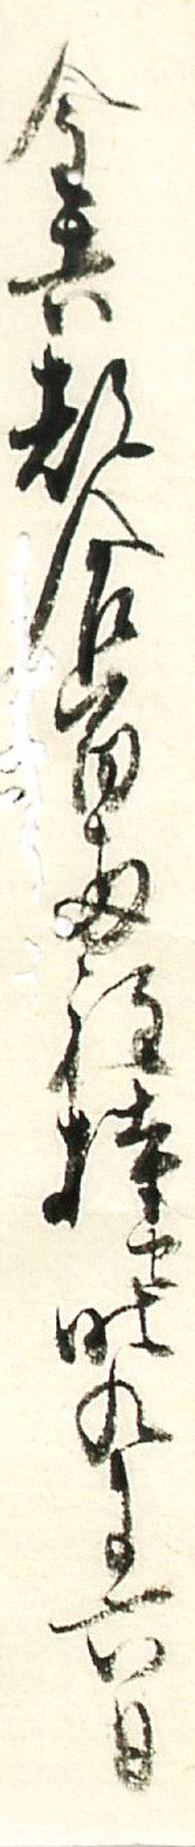金共都合百両程持せ昨九月六日
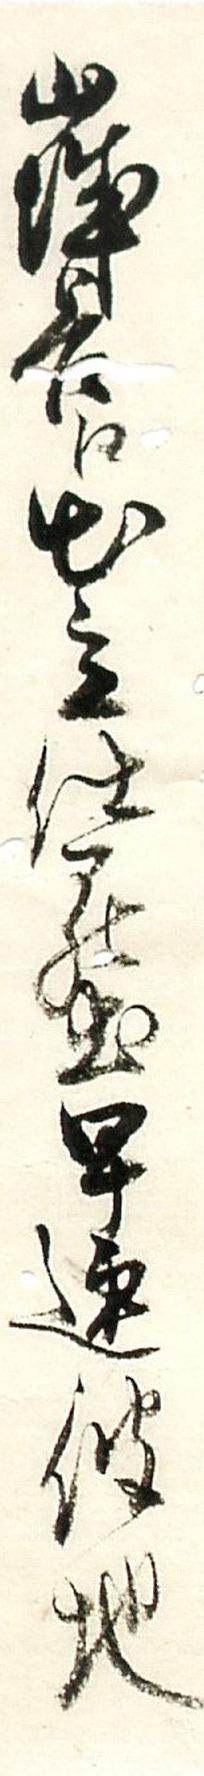山城谷え出立仕罷出早速彼地
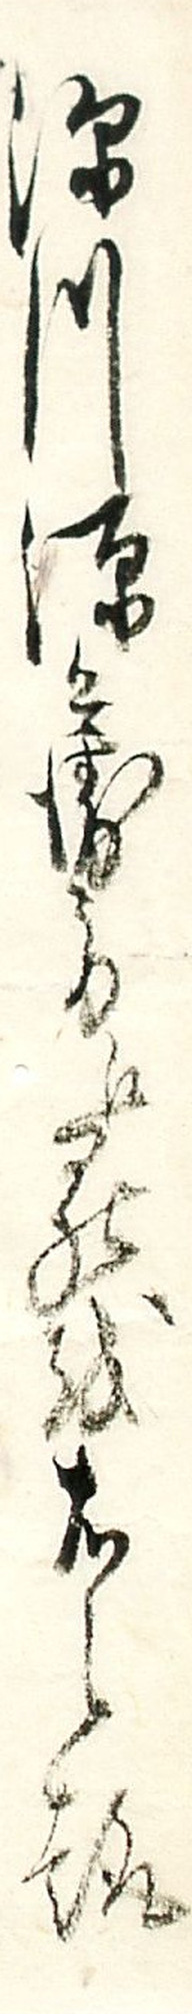深川源兵衛方え罷越右之趣
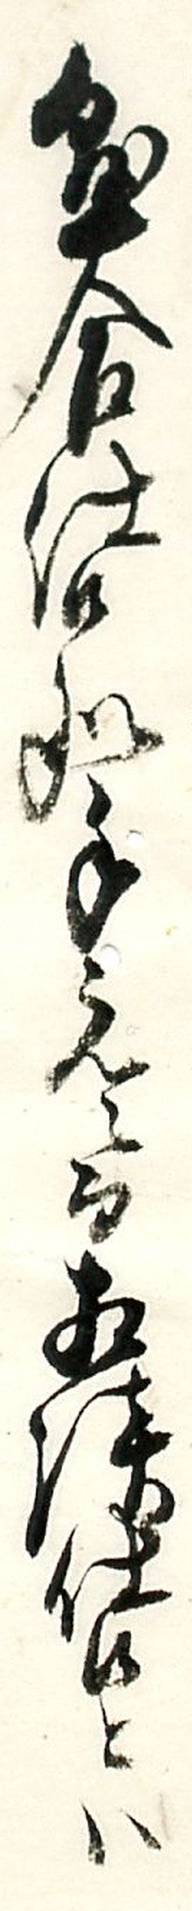懸合仕候処手元に而相談仕候とは
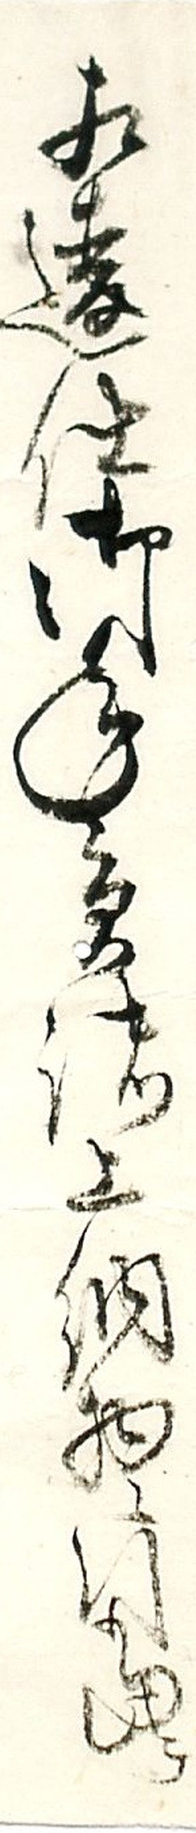相違仕御年貢諸上納物に引当て
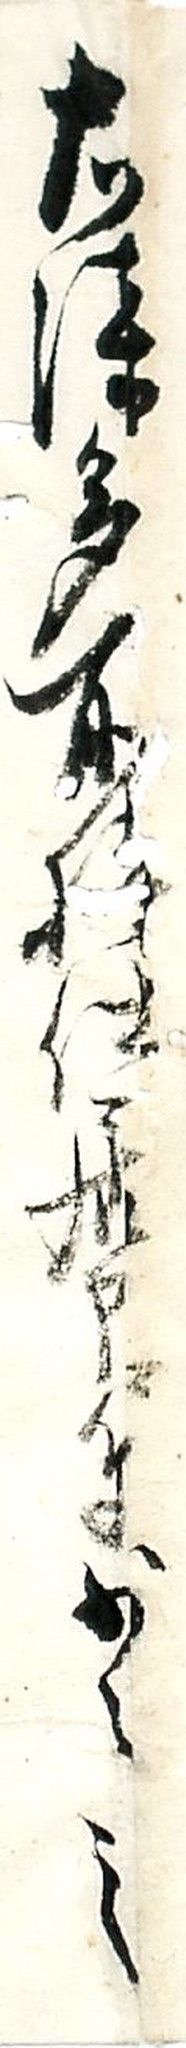右漆多所持仕居申に付少々之
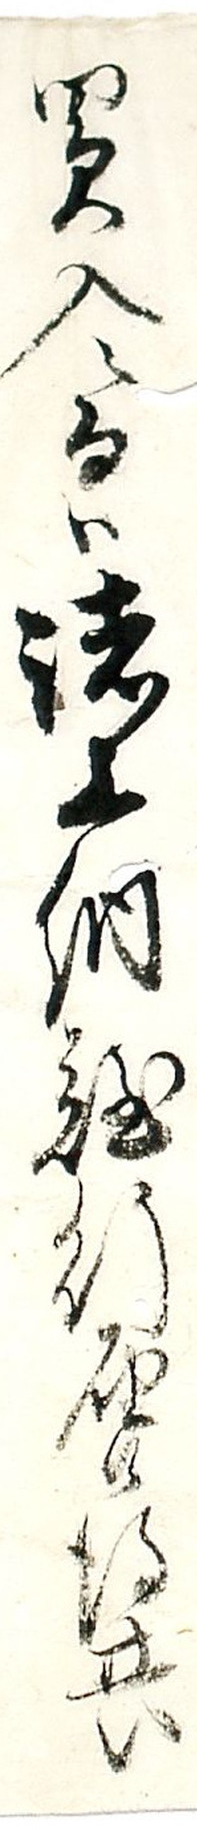買入に而は諸上納難行届候得共
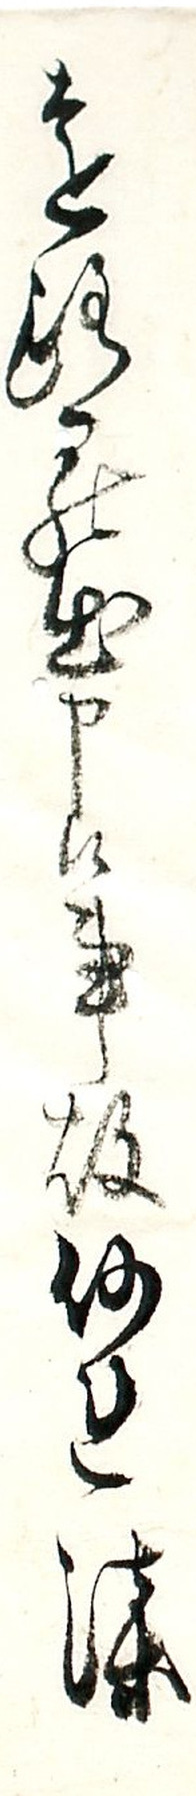遠路罷出申候事故何れ漆
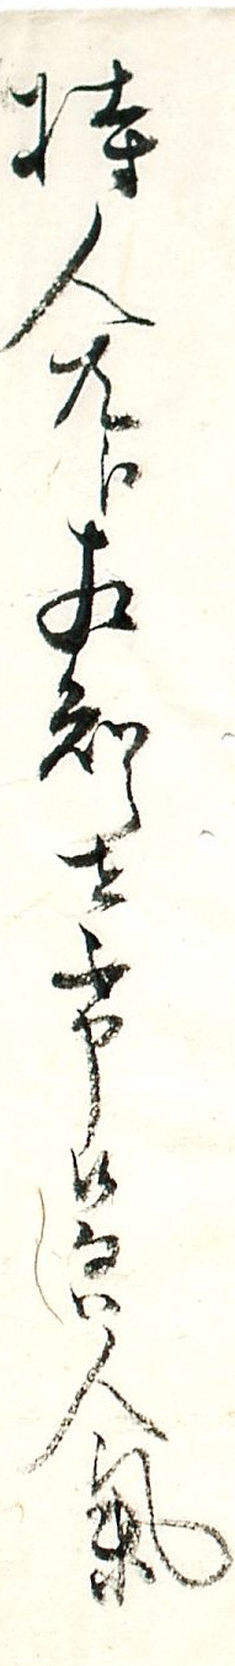持人共え相知らせ不申候而は人気
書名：乍恐横切ヲ以奉申上覚（山城谷漆買入銀一件ニ付）
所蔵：鳴門教育大学 Naruto University of Education
